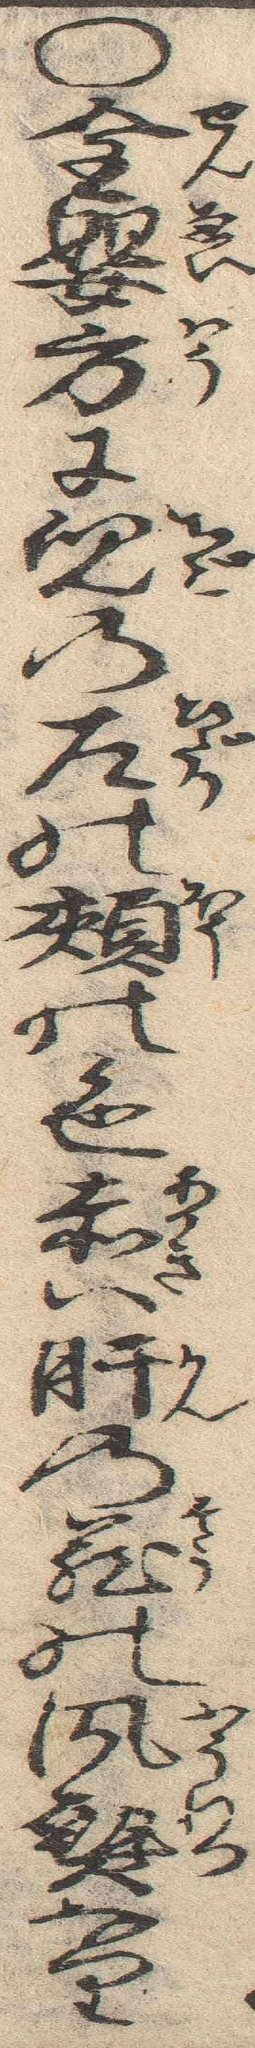◯全嬰方に児の左の頬の色赤は肝の臓の風𤍽なり
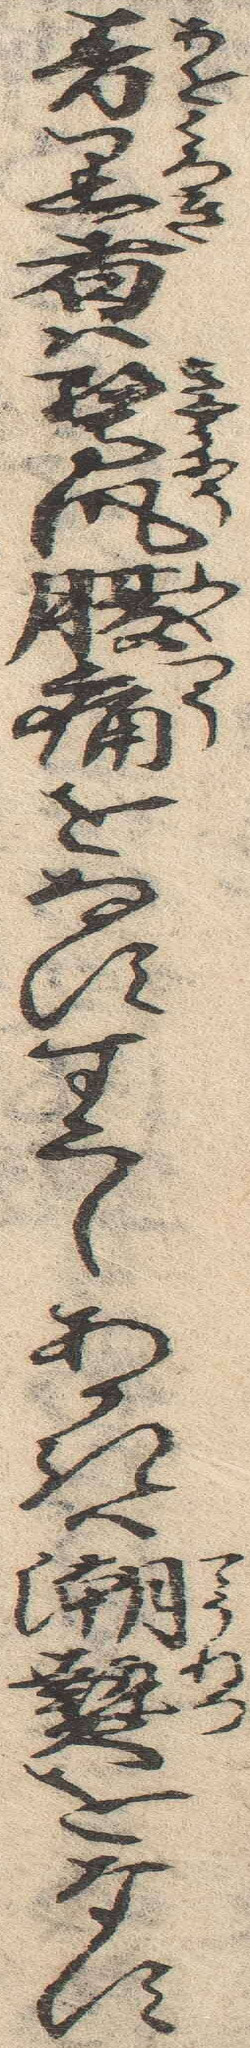青黒者は驚風腹痛をなすすこしあかきは潮𤍽をなす
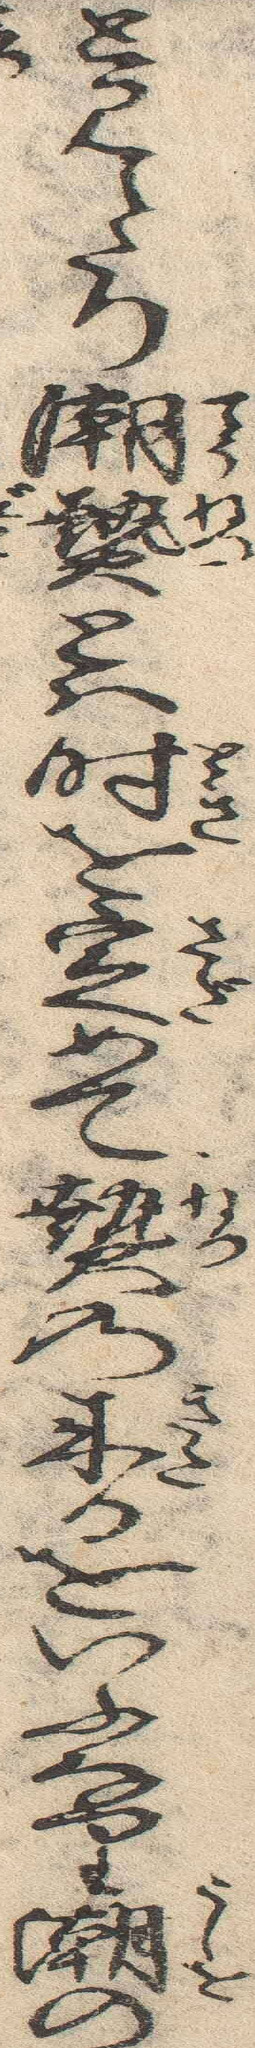と見えたり潮𤍽とは時を定めて𤍽の來るをいふなり潮の
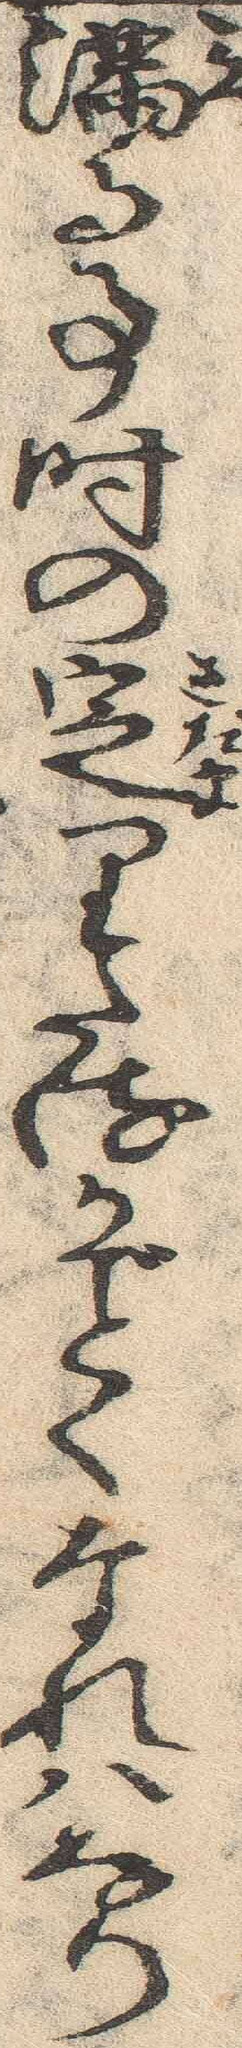満る事時の定りたるかごとくなれはなり
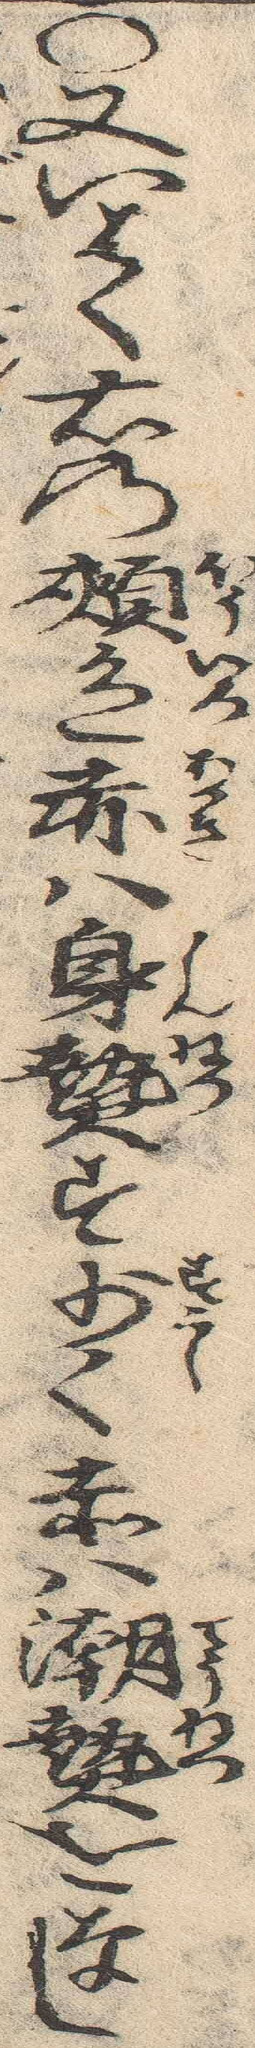◯又いはく右の頬色赤は身𤍽す少く赤は潮𤍽をなし
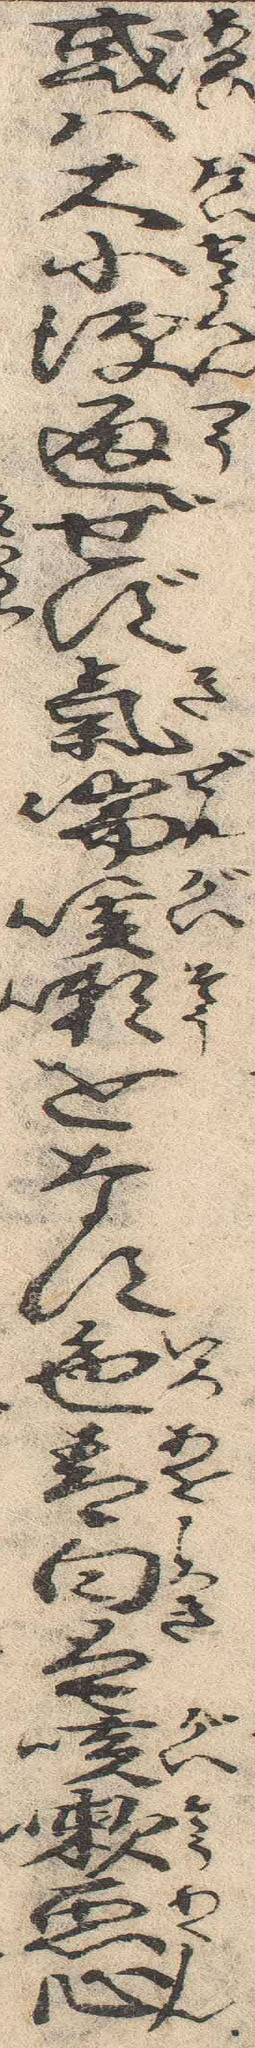或は大小便通ぜず氣喘咳嗽をなす色青白は咳嗽悪心
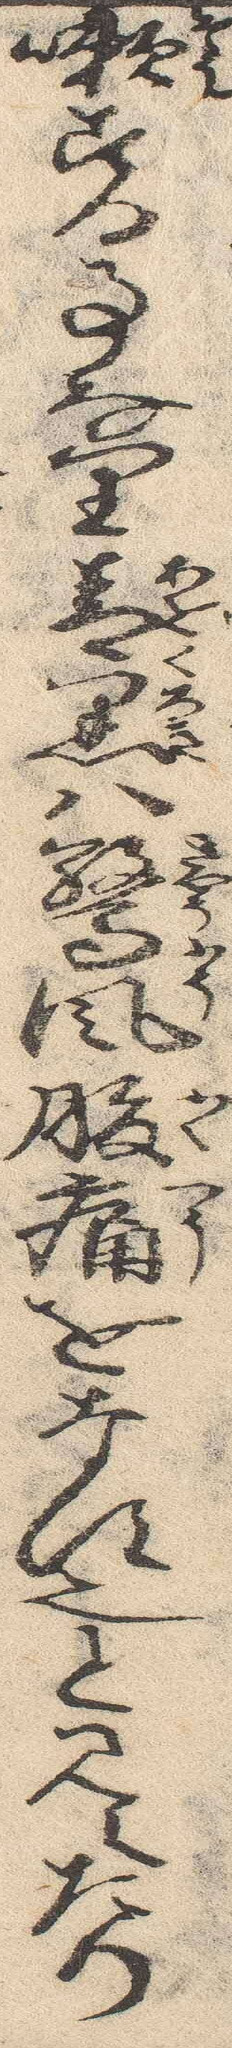嗽する事なり青黒は驚風腹痛をなす也と見えたり
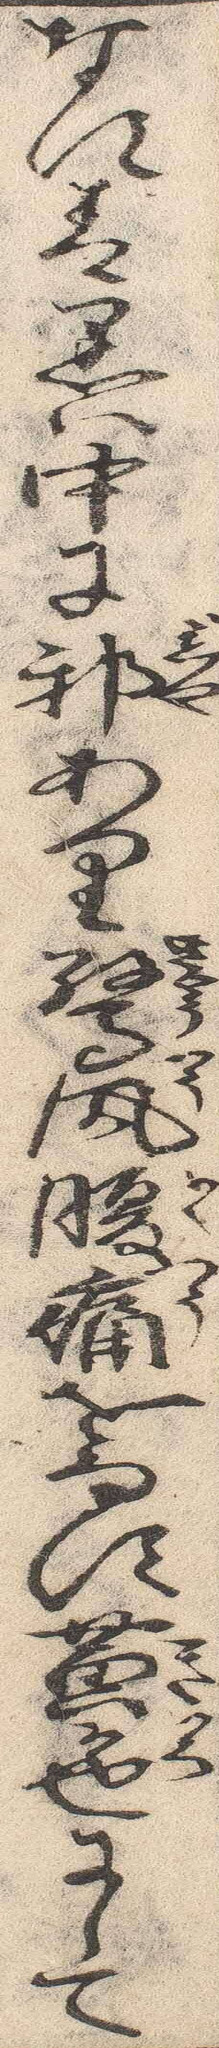なす青黒は中に邪あり驚風腹痛をなす黄色にして
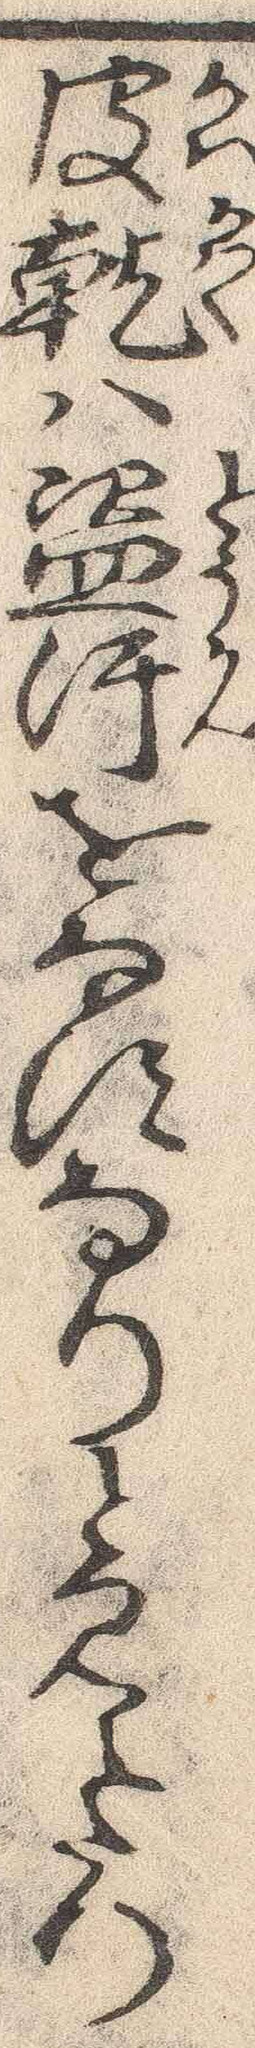皮乾は盗汗をなすなりと見えたり
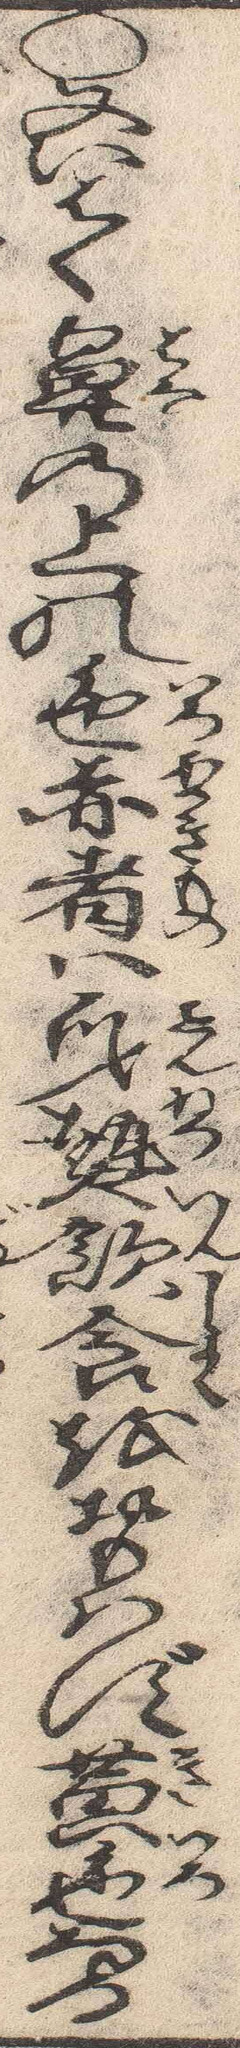◯又いはく鼻の上の色赤者は身𤍽飲食をおもはず黄色なる
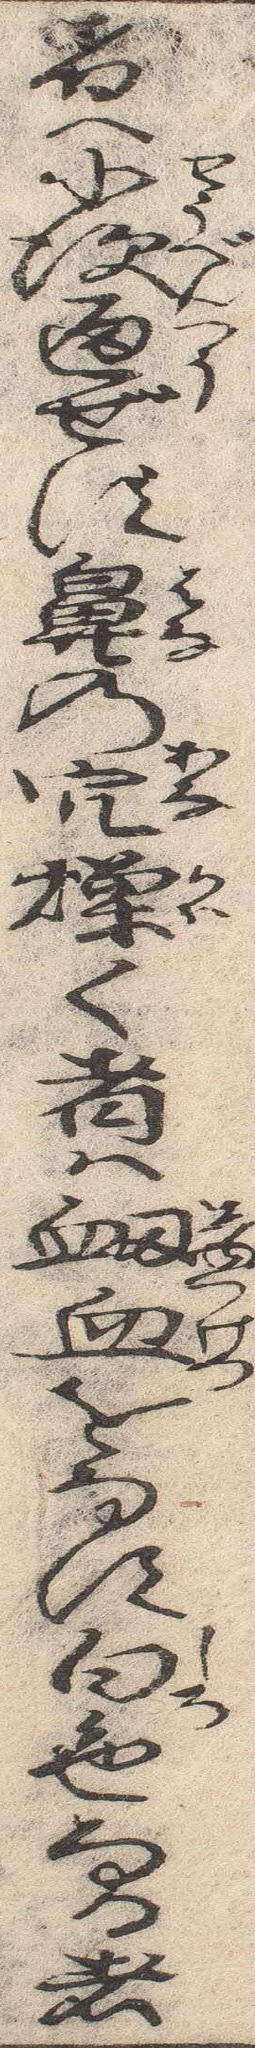者へ小便通ぜず鼻の穴燥く者は衂血をなす白色なる者
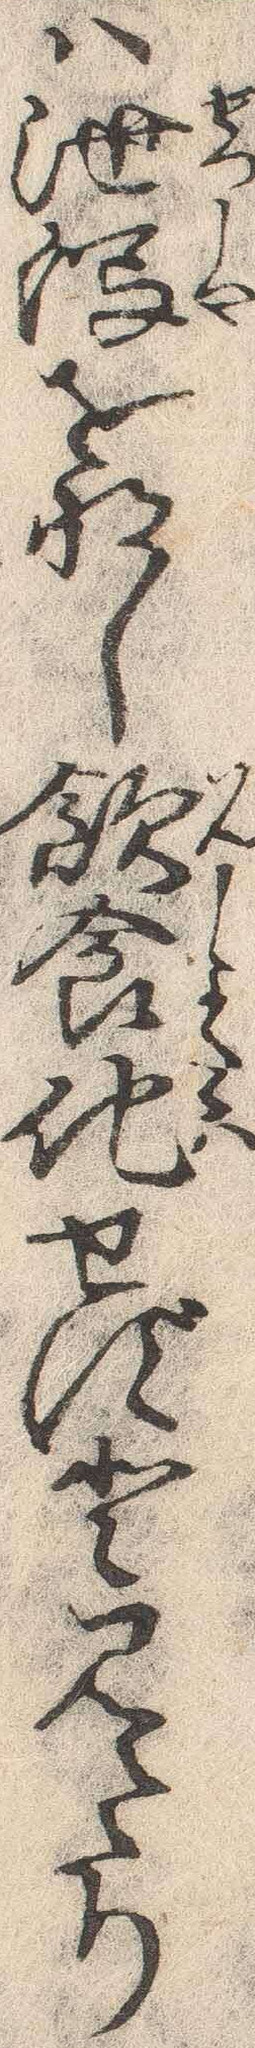は泄瀉をなし飲食化せずと見えたり
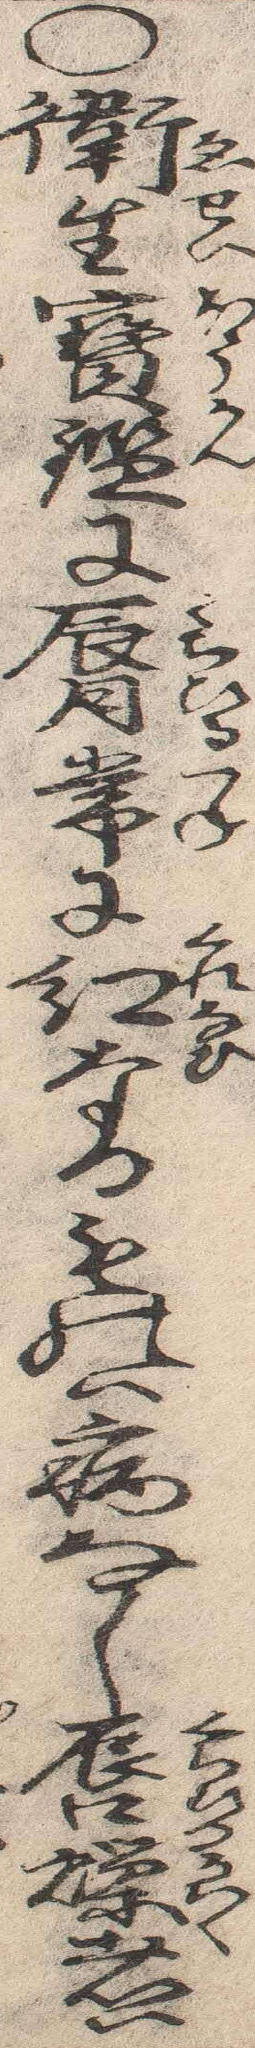◯衛生寳鑑に脣常に紅なるものは病なし唇燥者は
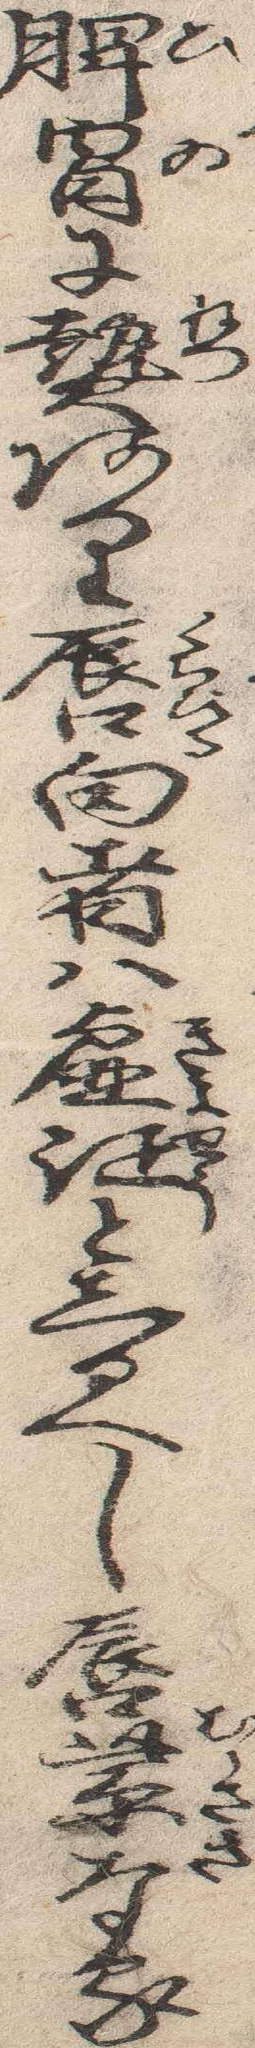脾胃に𤍽あり唇白者は虚証としるへし唇紫なる
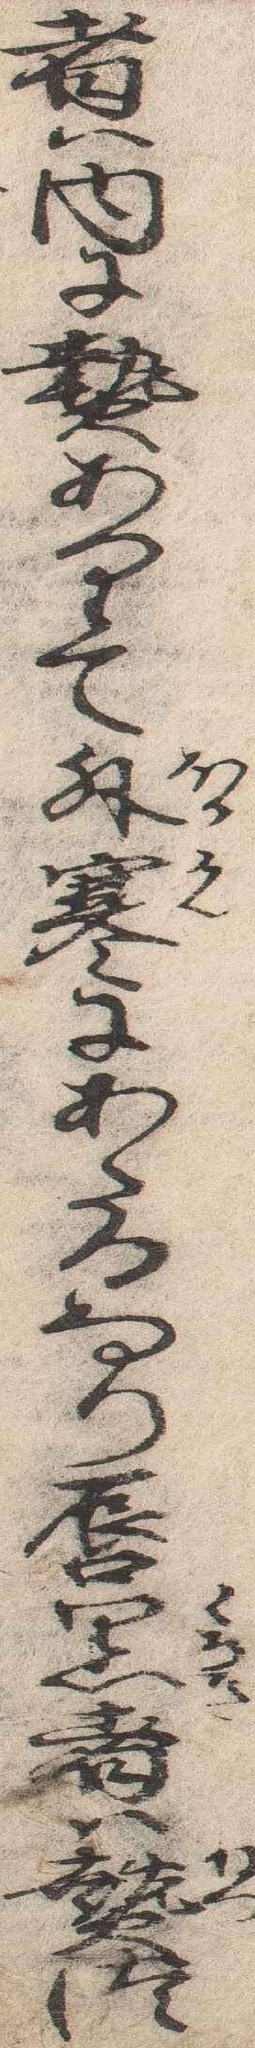者は内に𤍽ありて外寒にあたるなり唇黒者は𤍽つ
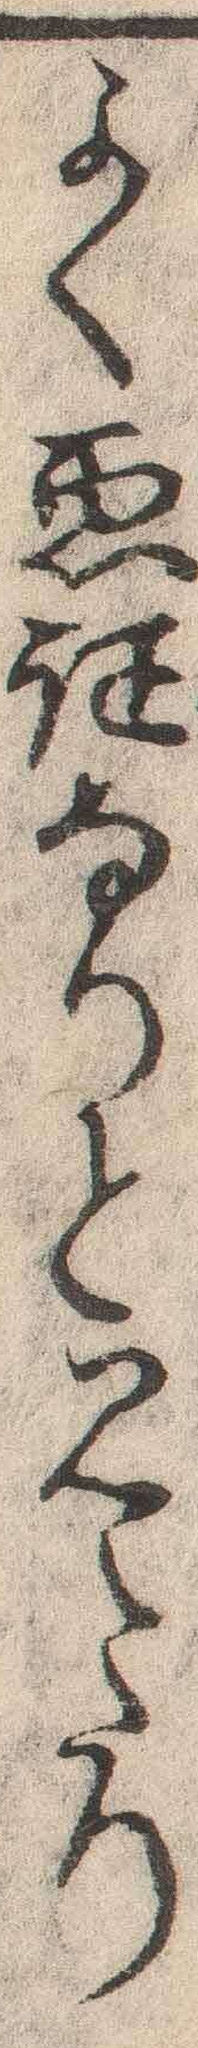よく悪証なりと見えたり
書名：小児必用養育草
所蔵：東京学芸大学附属図書館 国文学研究資料館
